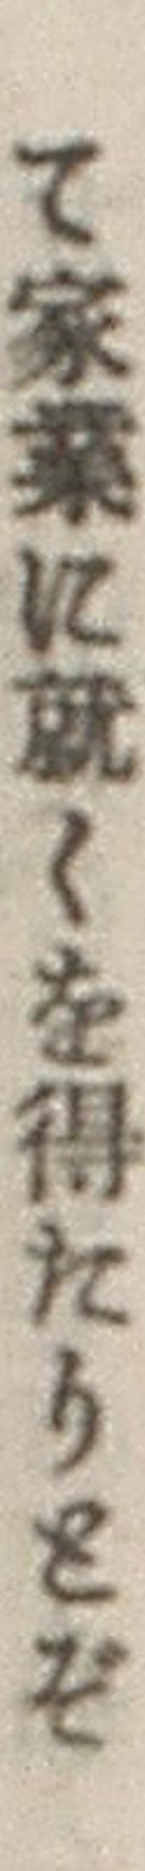て家業に就くを得たりとぞ
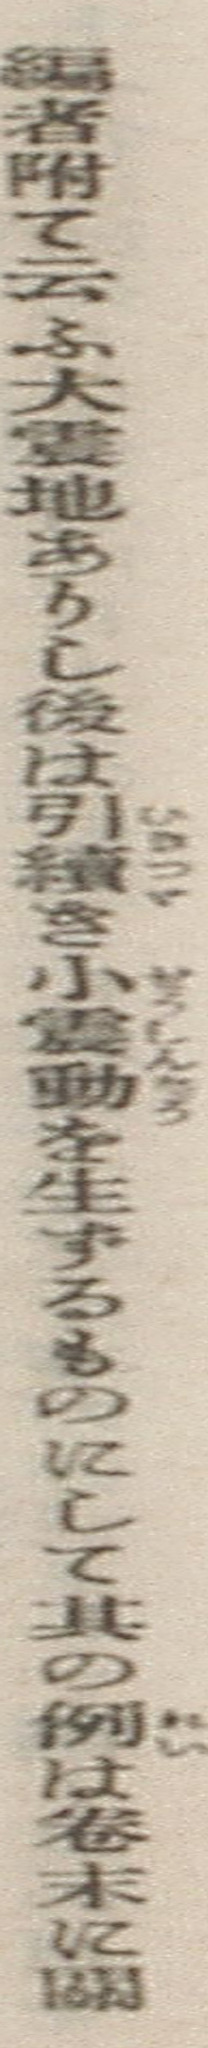編者附て云ふ大地震ありし後は引續き小震動を生ずるものにして其の例は巻末に關
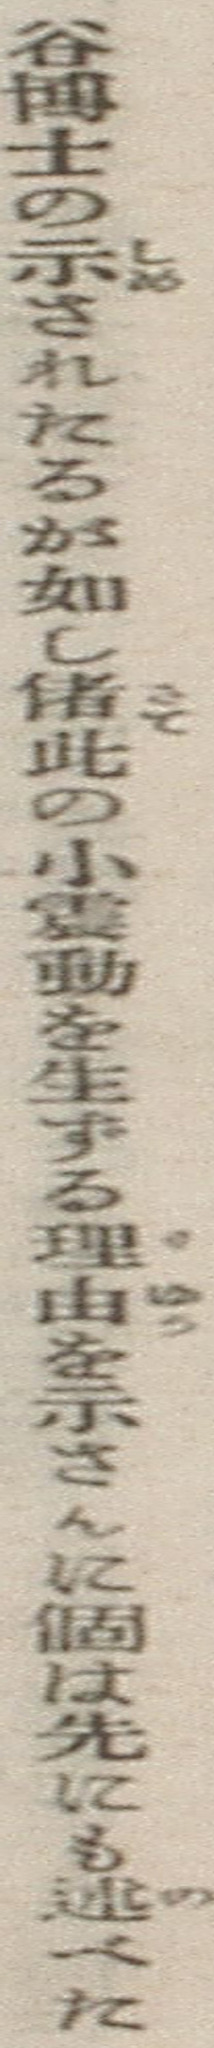谷博士の示されたるが如し偖此の小震動を生ずる理由を示さんに個は先にも述べた
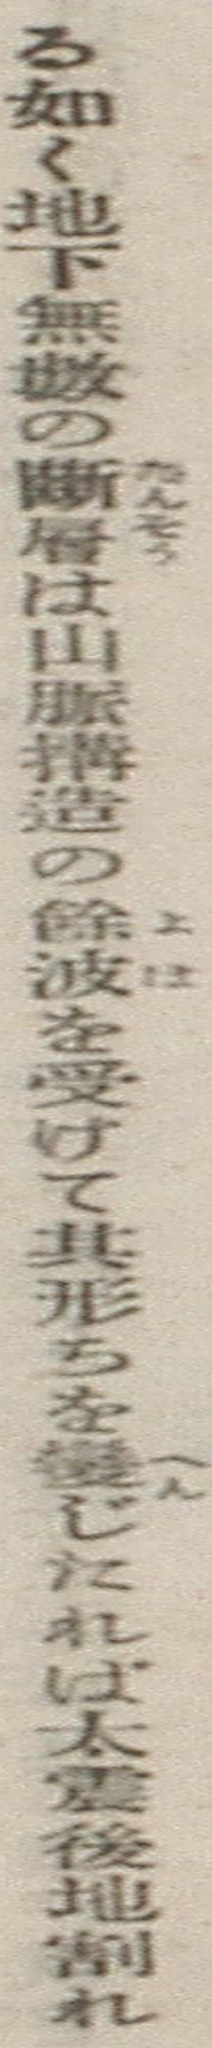る如く地下無数の断層は山脈構造の餘波を受けて其形ちを變じたれば太震後地割れ
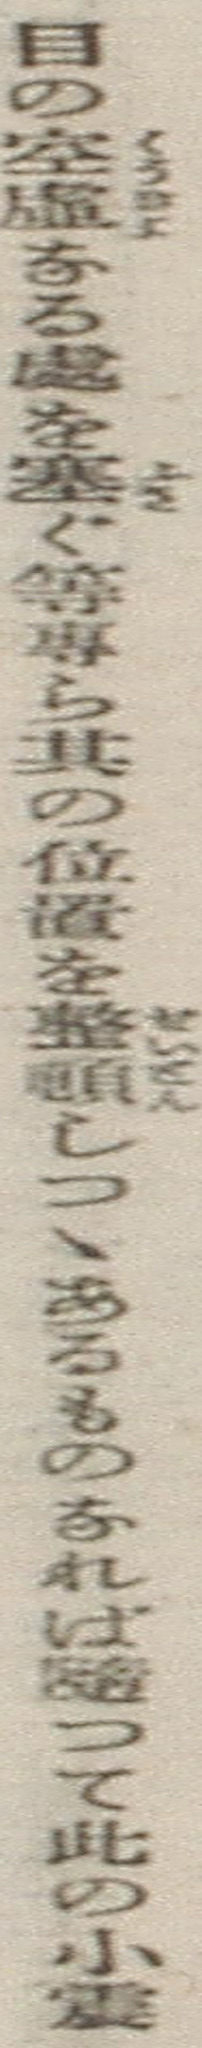目の空虚なる處を塞ぐ等専ら其の位置を整頓しつゝあるものなれば随つて此の小震
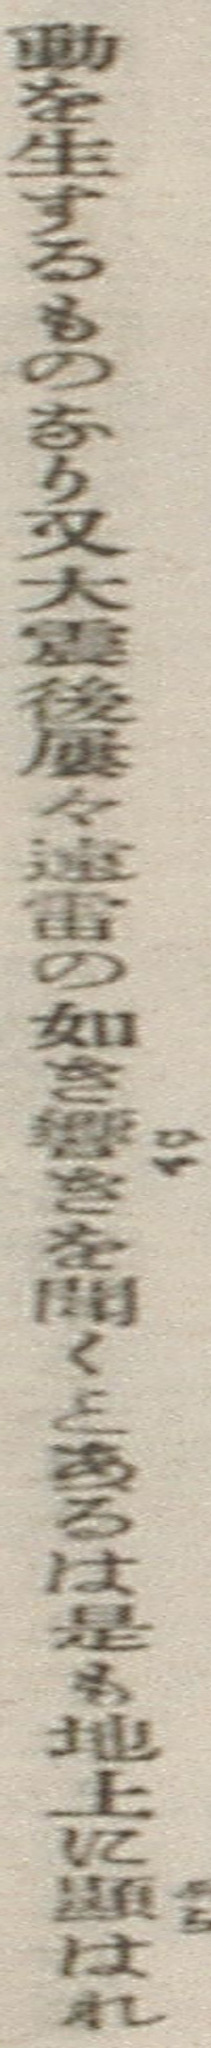動を生するものなり又大震後屢々遠雷の如き響きを聞くことあるは是も地上に顕はれ
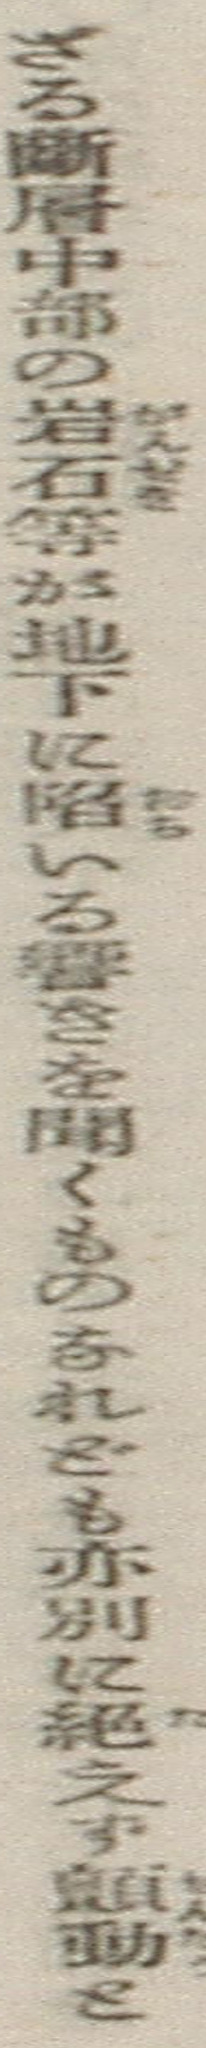ざる断層中部の岩石等が地下に陥いる響きを聞くものなれども亦別に絶えず顫動を
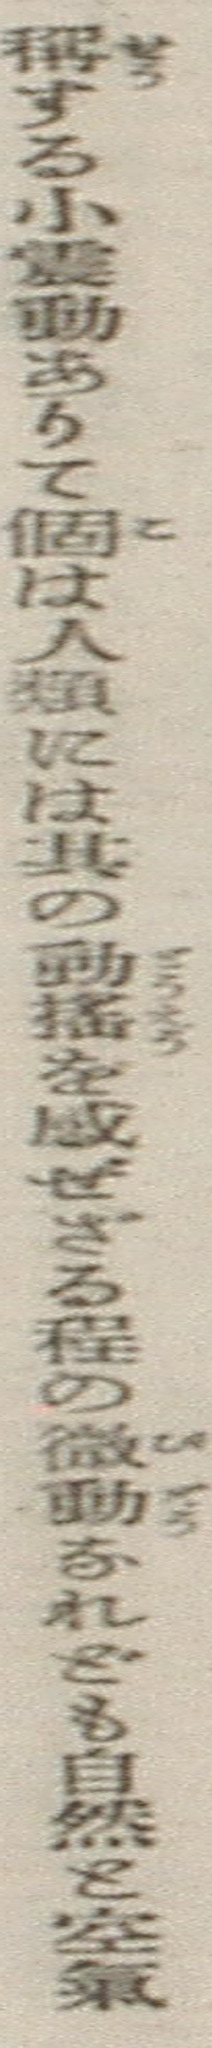稱する小震動ありて個は人類には其の動揺を感ぜざる程の微動なれども自然と空氣
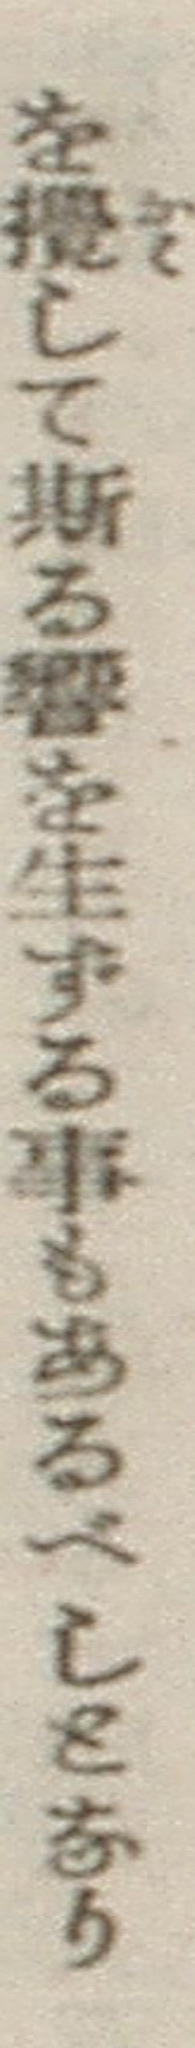を攪して斯る響を生ずる事もあるべしとなり
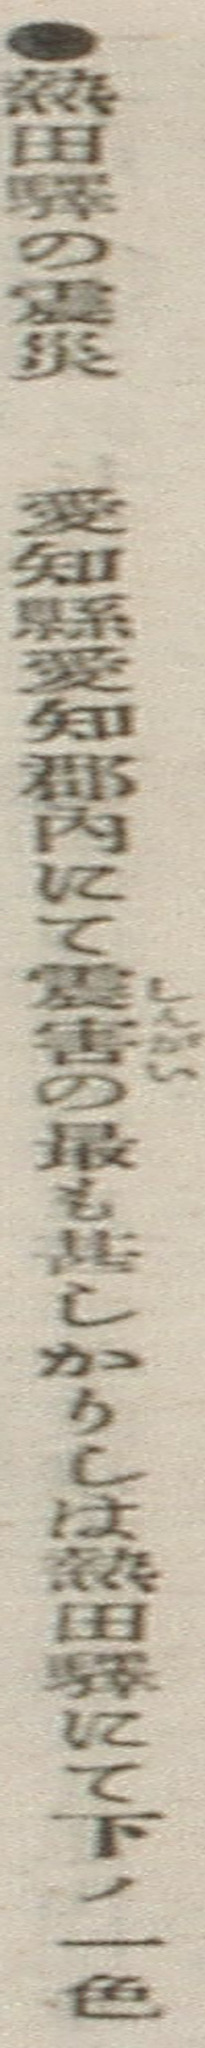●熱田驛の震災愛知縣愛知郡内にて震害の最も甚しかりには熱田驛にて下ノ一色
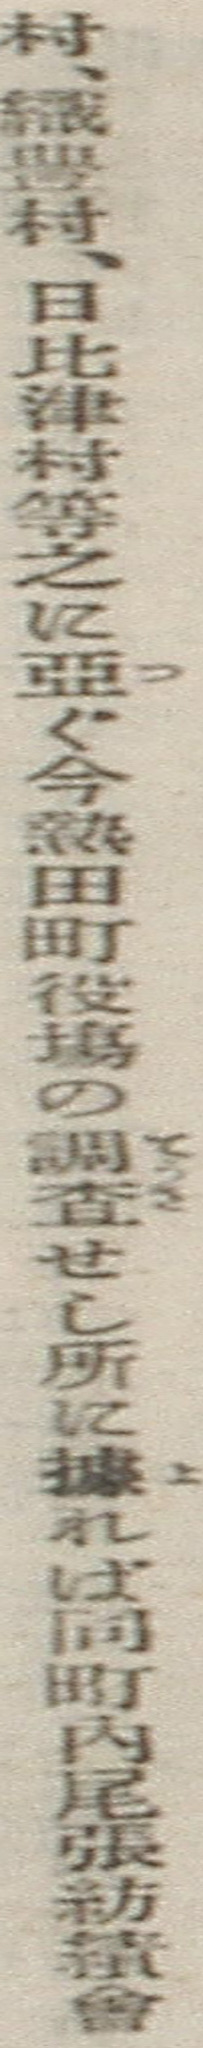村、織豊村、日比津村等之に亞ぐ今熱田町役場の調査せし所に據れば同町内尾張紡績會
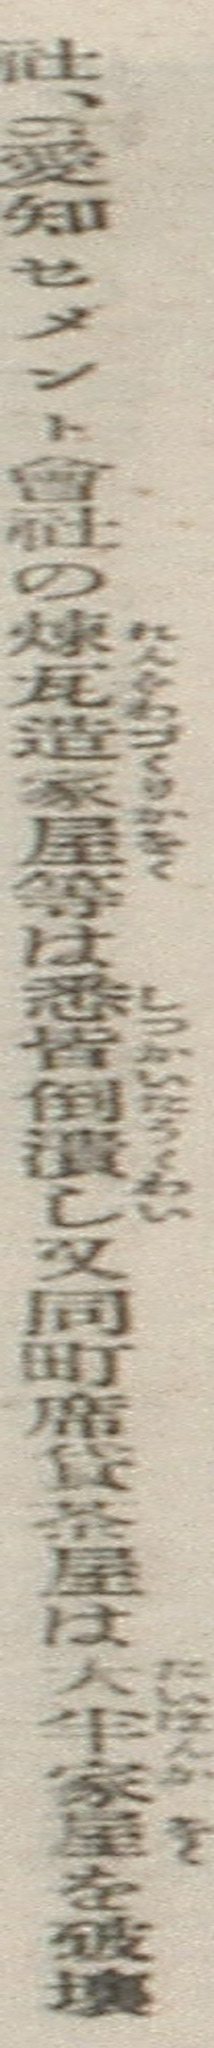社、愛知セメント會社の煉瓦造家屋等は悉皆倒潰し又同町席貸茶屋は大半家屋を破壊
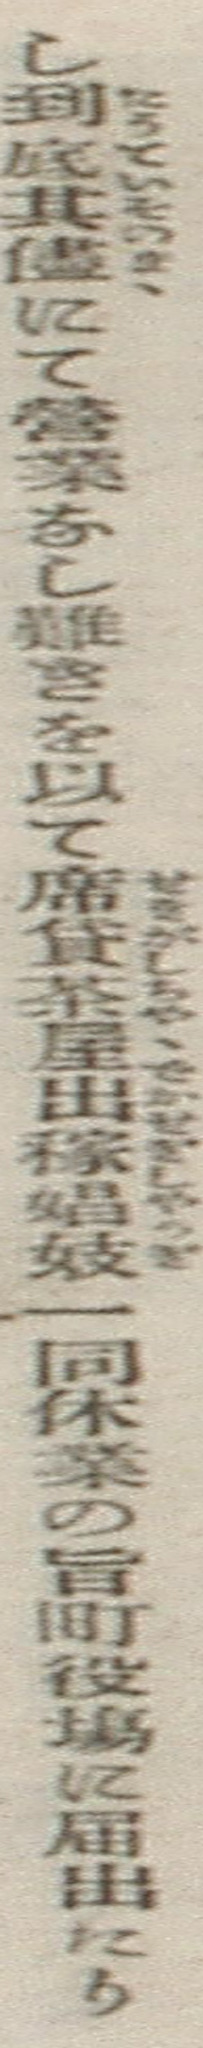し到底其儘にて営業なし難きを以て席貸茶屋出稼娼妓一同休業の旨町役場に届出たり

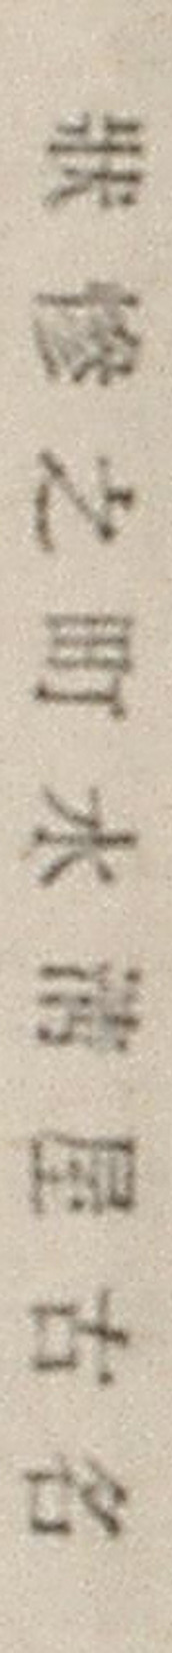名古屋清水町之惨状

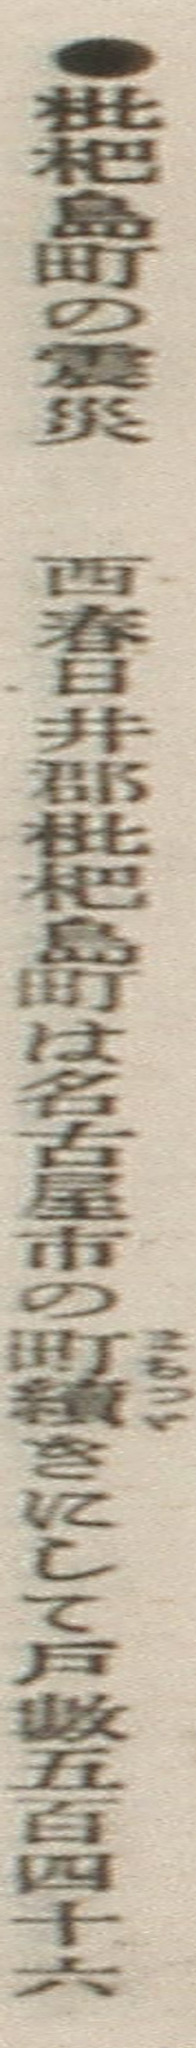●枇杷島町の震災西春日井郡枇杷島町は名古屋市の町続まちつゞきにして戸数五百四十六
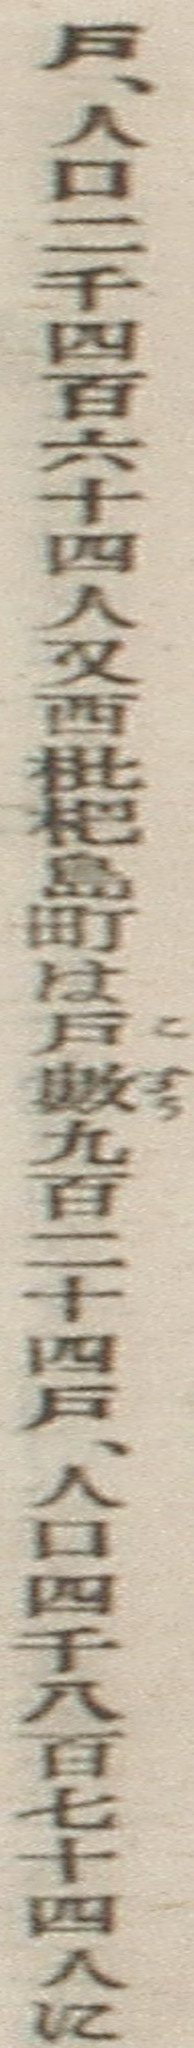戸、人口二千四百六十四人又西枇杷島町は戸数こすう九百二十四戸、人口四千八百七十四人に
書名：愛知岐阜福井三県　大地震見聞録（内題）
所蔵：東京大学地震研究所図書室 Earthquake Research Institute Library, The University of Tokyo, JAPAN
